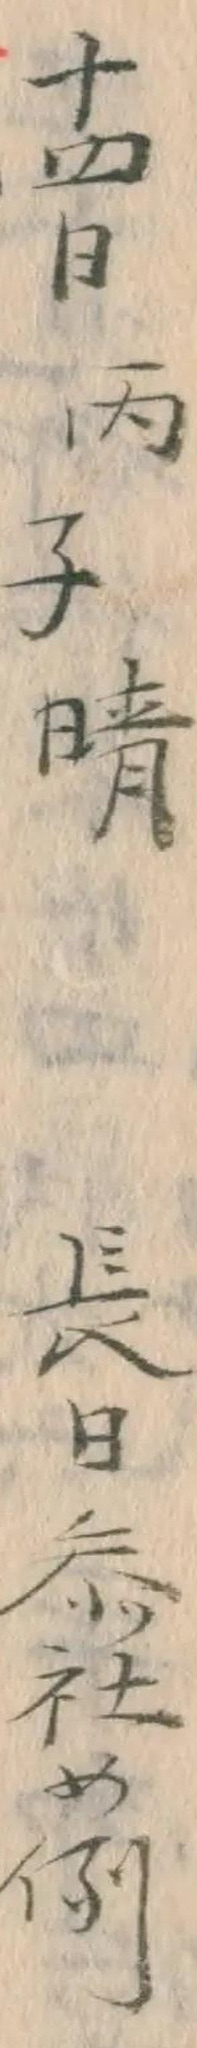十四日丙子晴長日参社如例
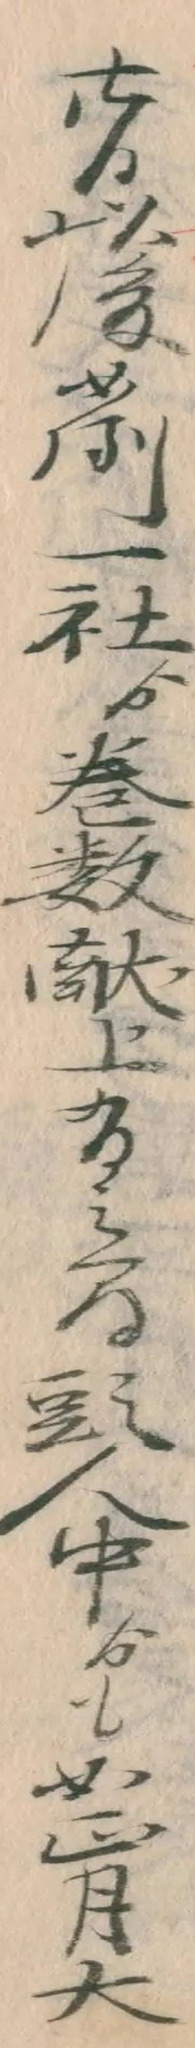一廿日以後如例一社ゟ巻数献上有之間頭人中ゟも如正月大
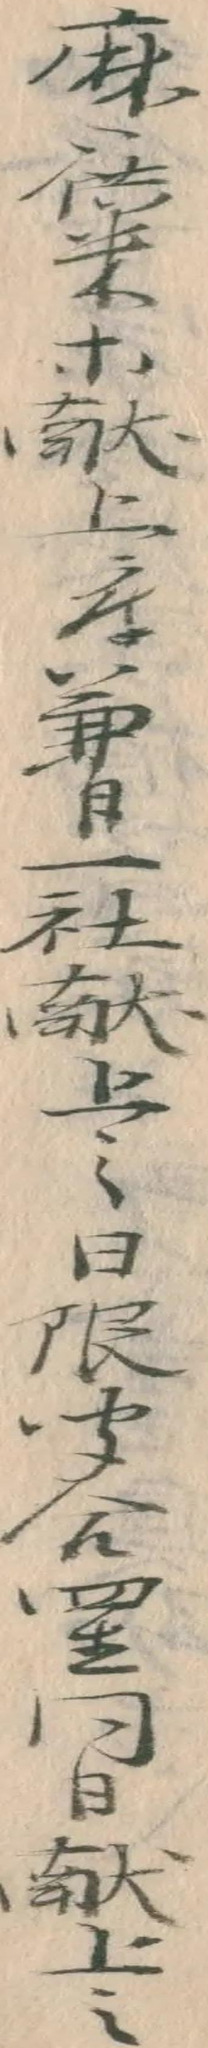麻御供米等献上ニ付兼日一社献上之日限聞合置同日献上之
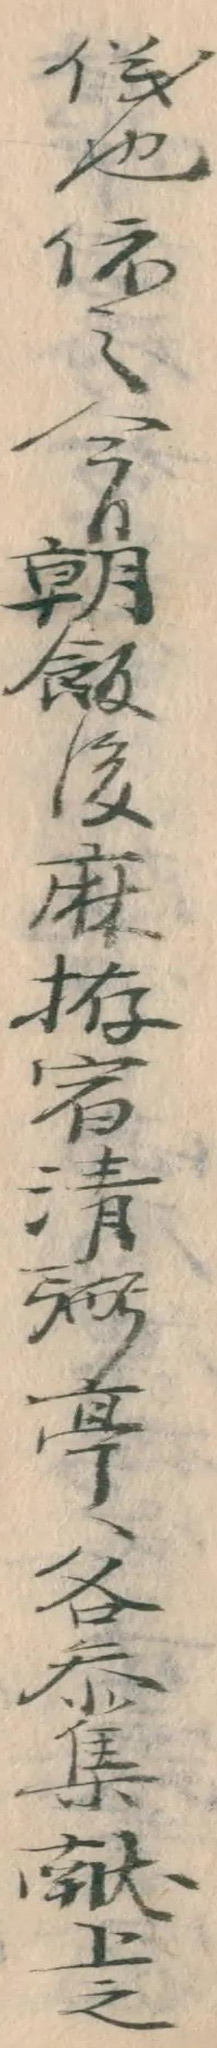儀也依之今日朝飯後麻拵宿清弼亭へ各参献上之
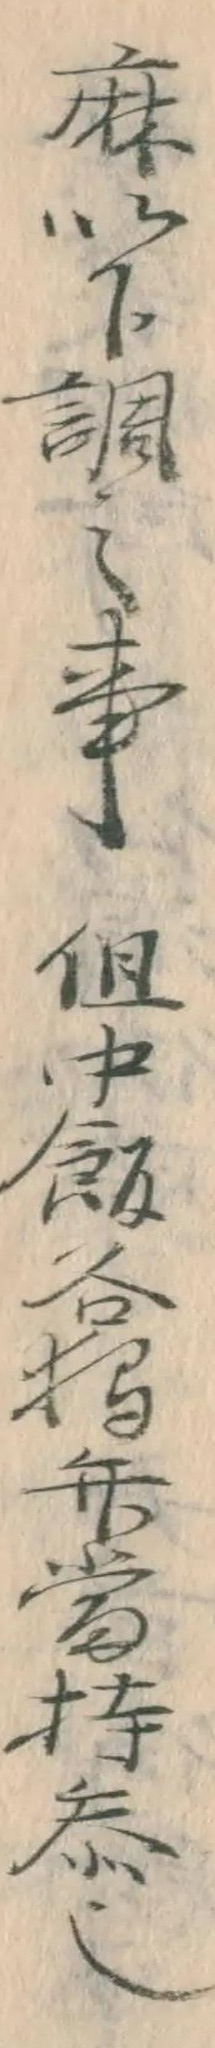麻以下調之事但中飯各掲弁當持参也
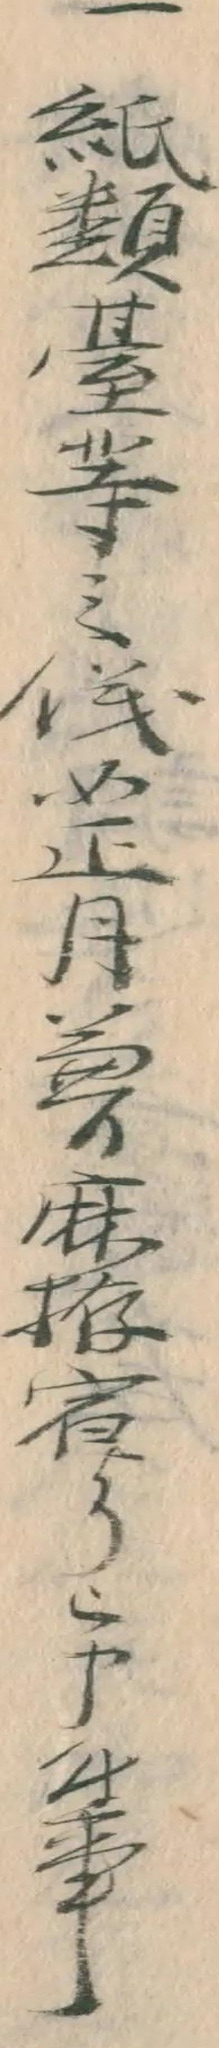一紙類臺等之儀如正月兼日麻拵宿より被申付事

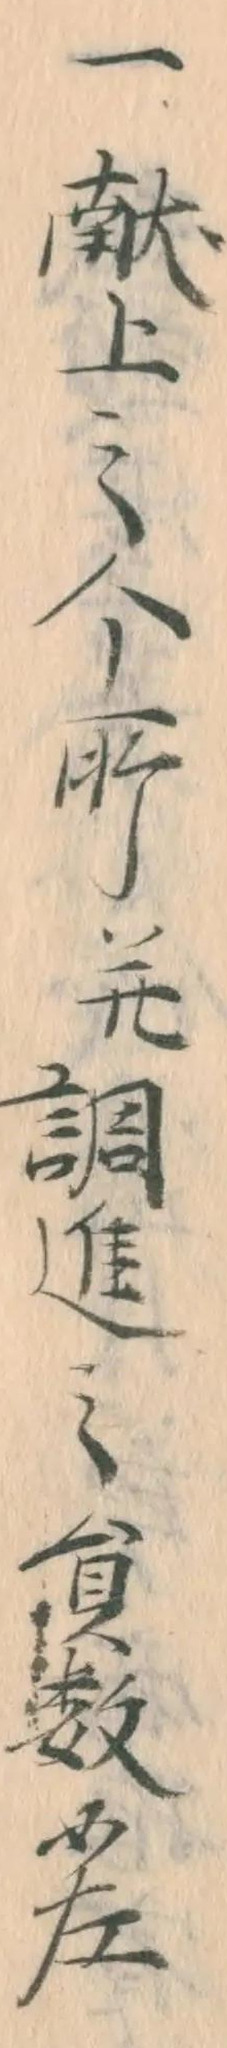一献上之人之所并調進之員数如左
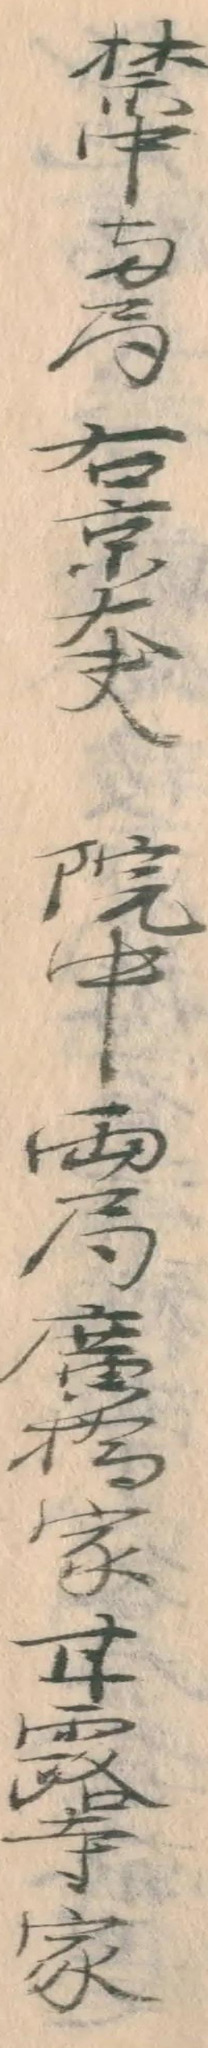禁中両局右京大夫院中両局広橋家甘露寺家
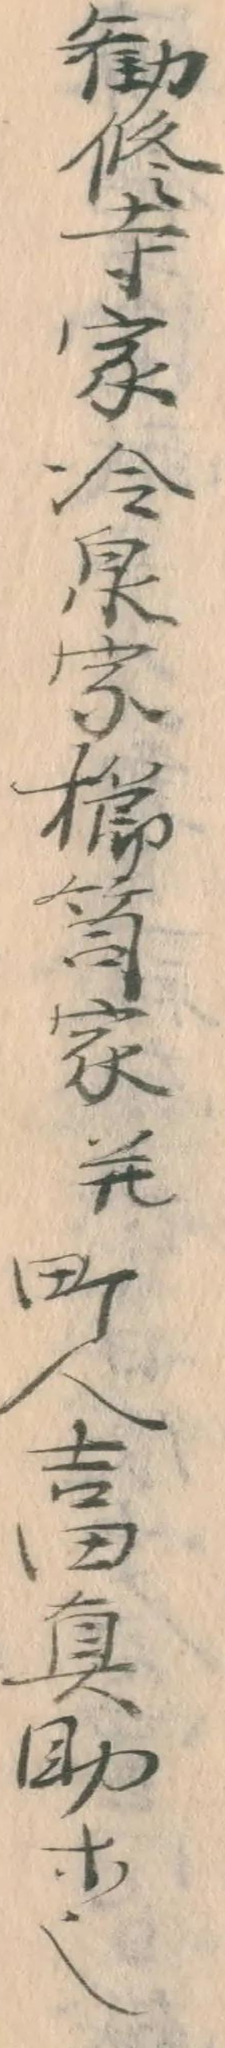勧修寺家冷泉家櫛笥家并町人吉田貞助等也
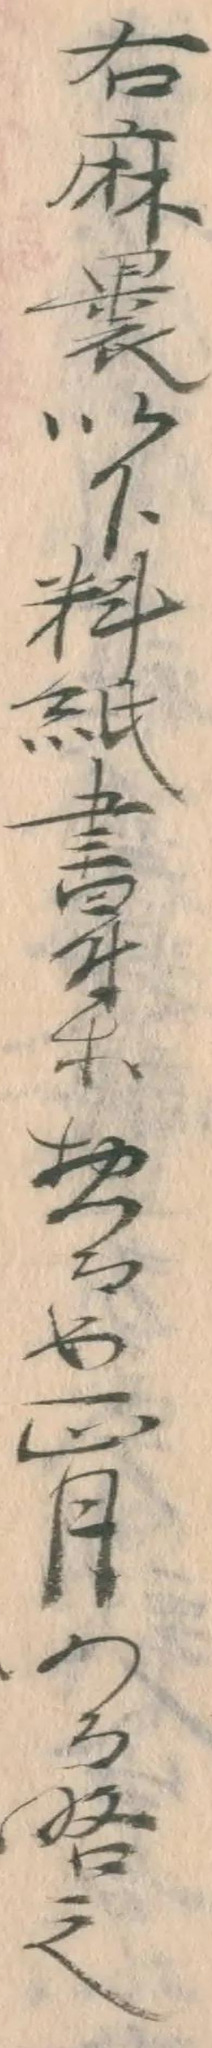右麻褁以下料紙書付等惣而如正月仍而略之
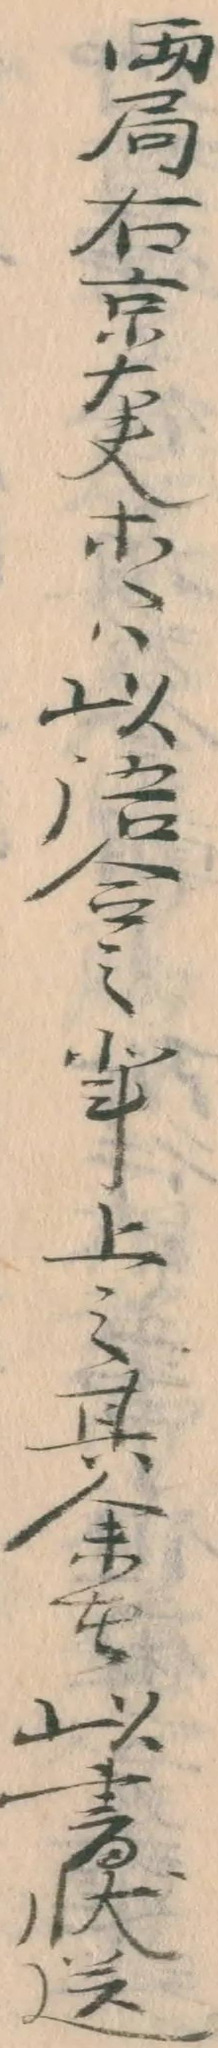両局右京大夫等へハ以語合之輩上之其余者以書状送
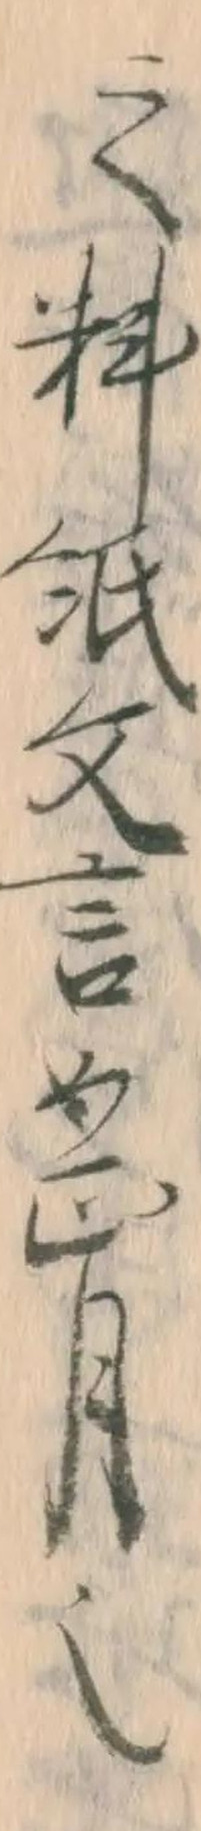之料紙文言如正月也
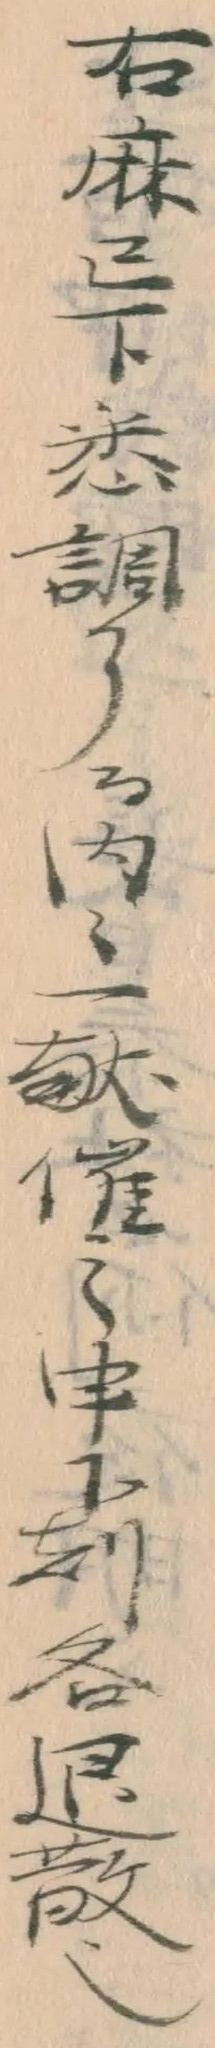右麻已下悉調了而内々一献催之申下刻各退散也
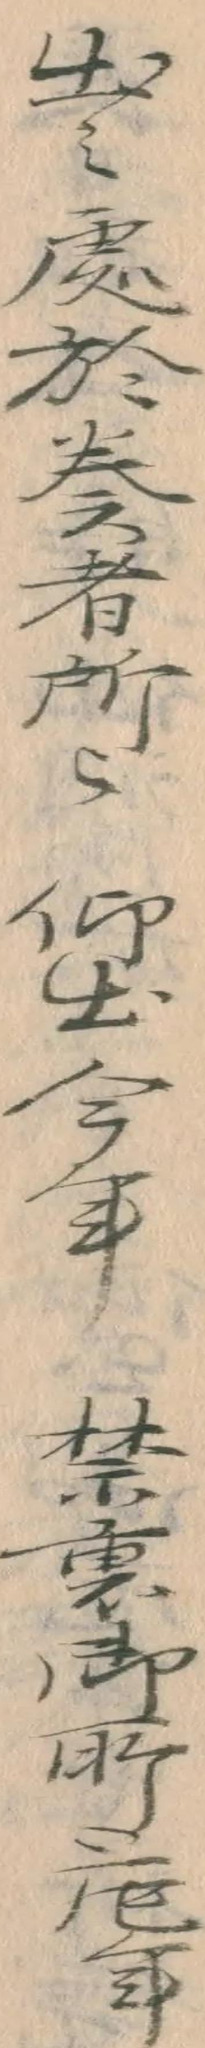出之處於奏者所被仰出今年禁裏御所御厄年
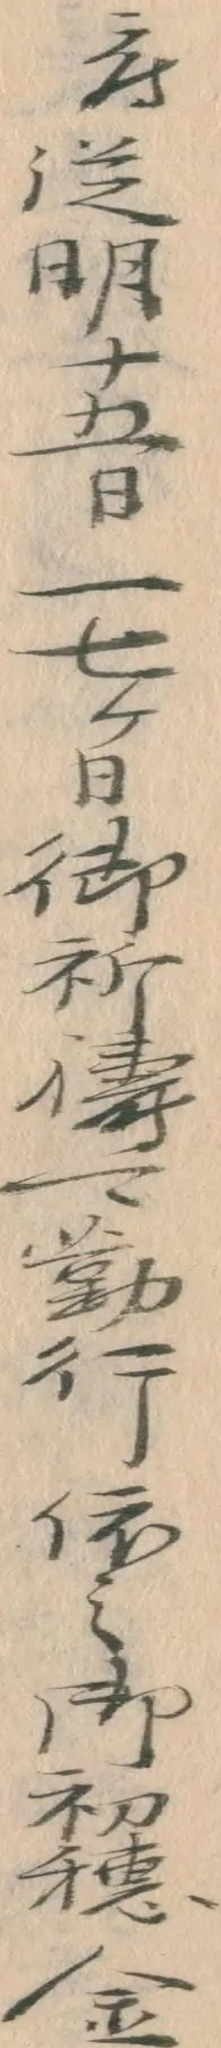ニ付従明十五日一七ケ日御祈祷可勤行依之御初穂金
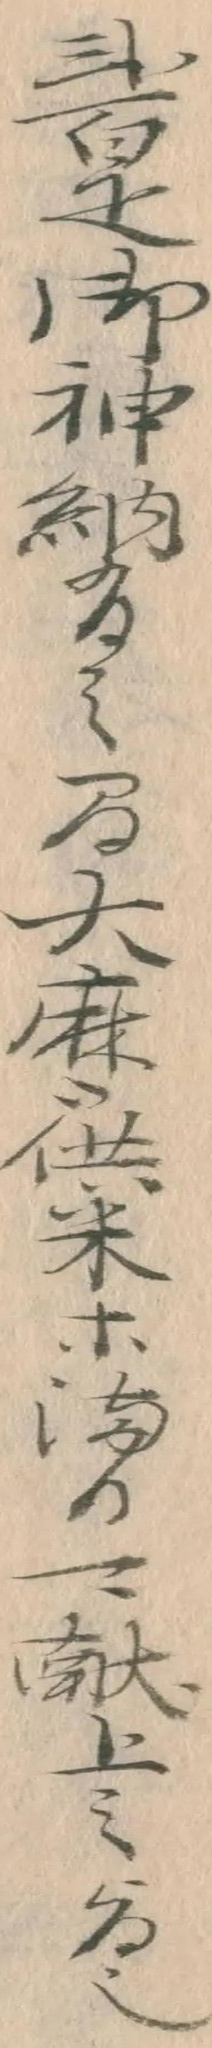弐百疋御神納有之間大麻御供米等満日可献上之旨也
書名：賀茂社記録. 第73冊
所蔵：国立国会図書館 National Diet Library, JAPAN
